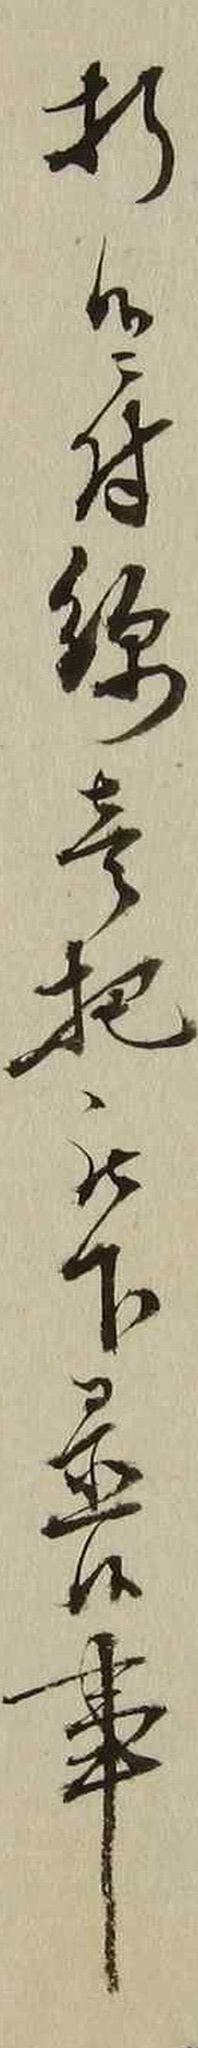折候ニ付綿壱把被下置候事
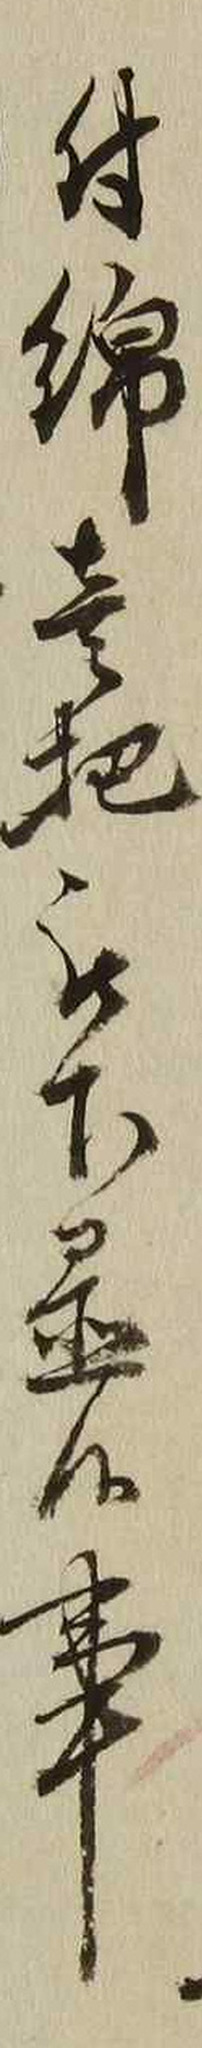付綿壱把被下置候事
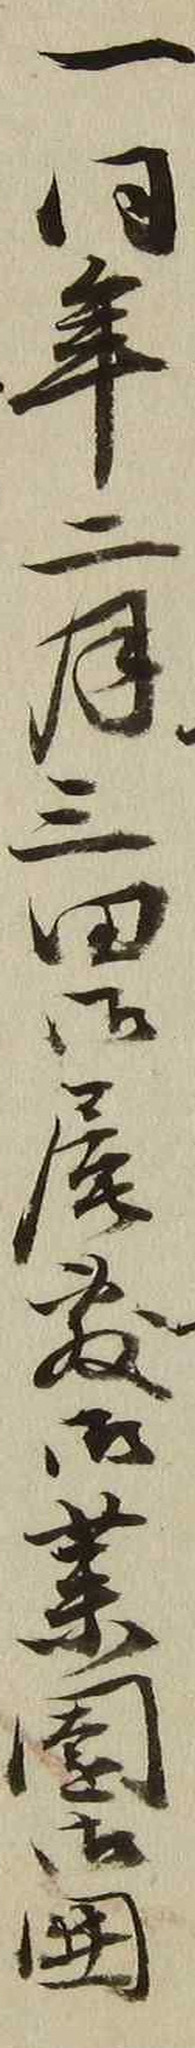一同年二月三田御屋敷御薬園御囲
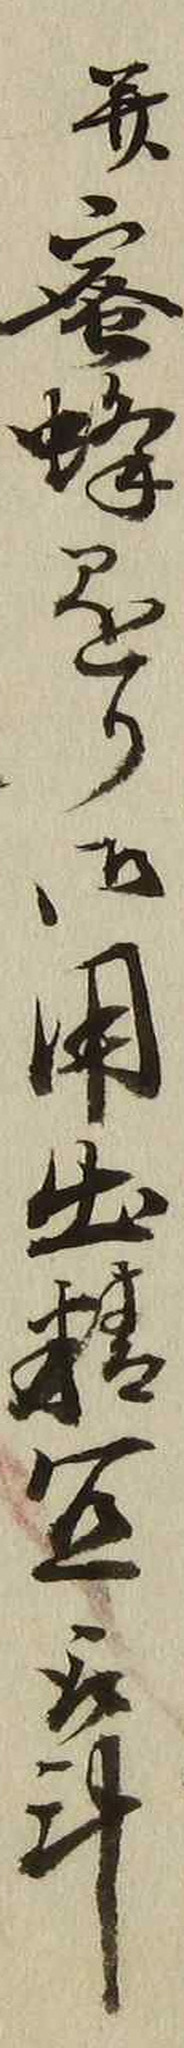并蜜蜂懸り御用出精宜取計
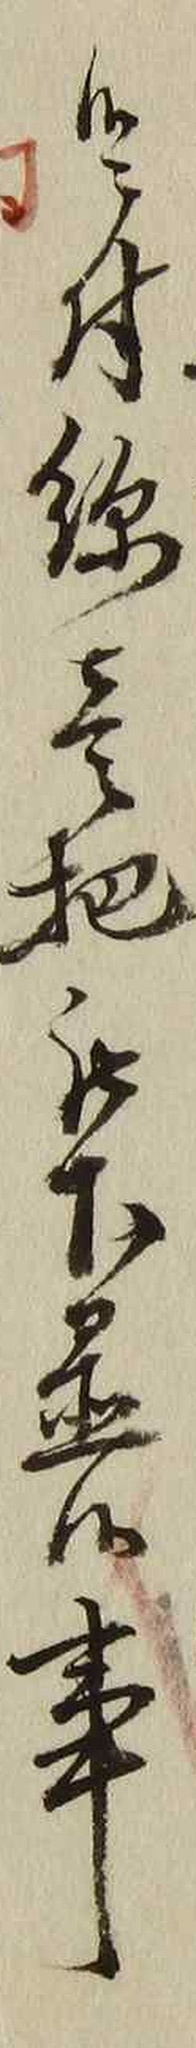候ニ付綿壱把被下置候事
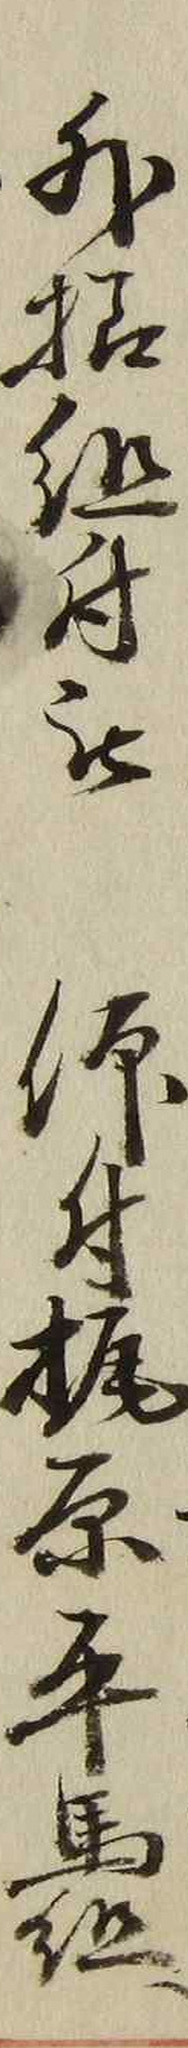外様組付被仰付梶原平馬組へ
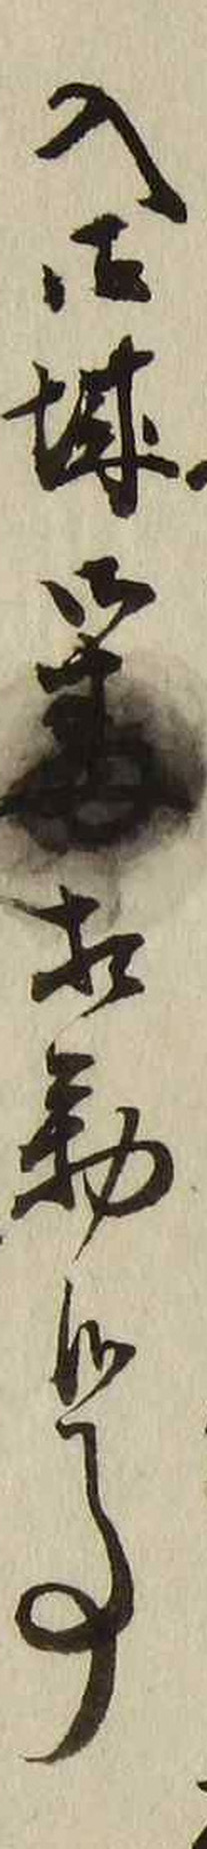入御城御番相勤候事
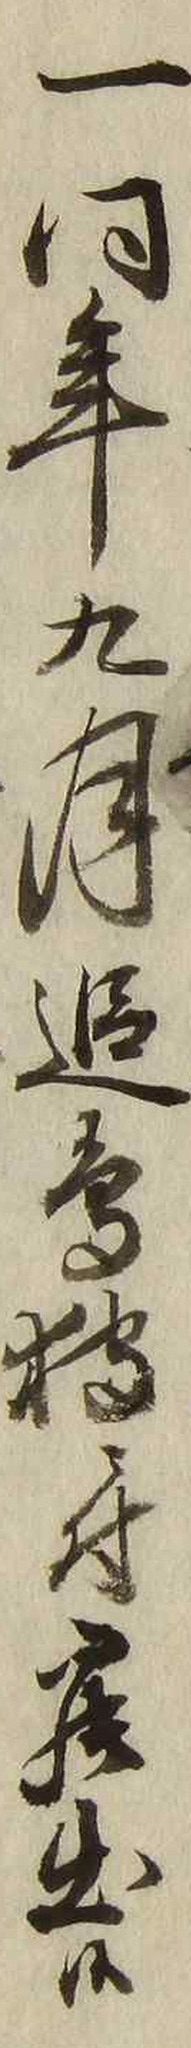一同年九月追鳥狩ニ付罷出候
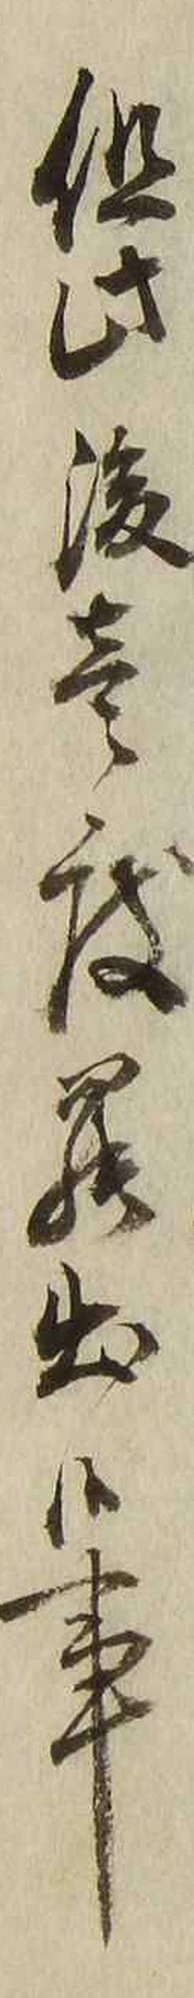但此後壱度罷出候事

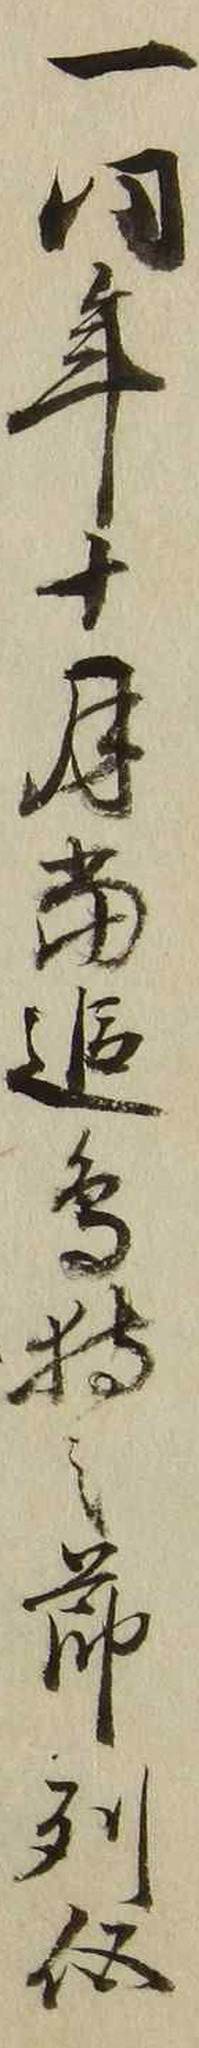一同年十月当追鳥狩之節列伍
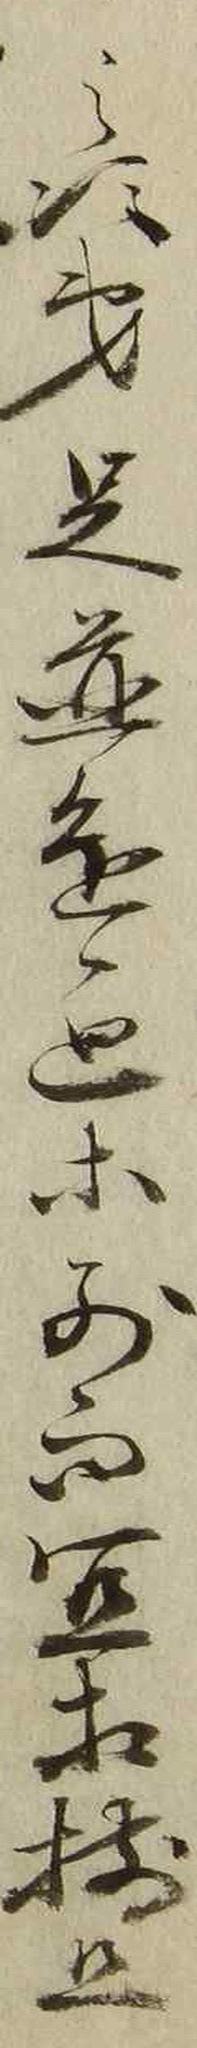之次第足並進退等別而宜相揃且
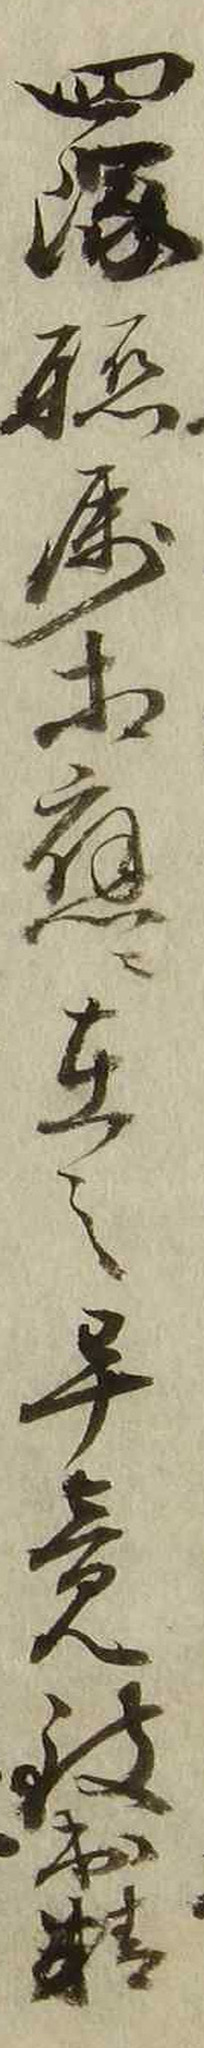四隊聯属相応ニ在之畢竟致出精
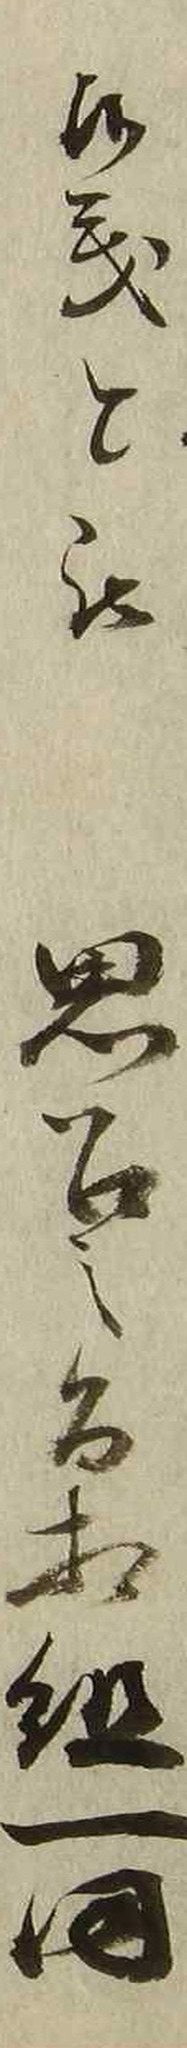候義と被思召之旨相組一同
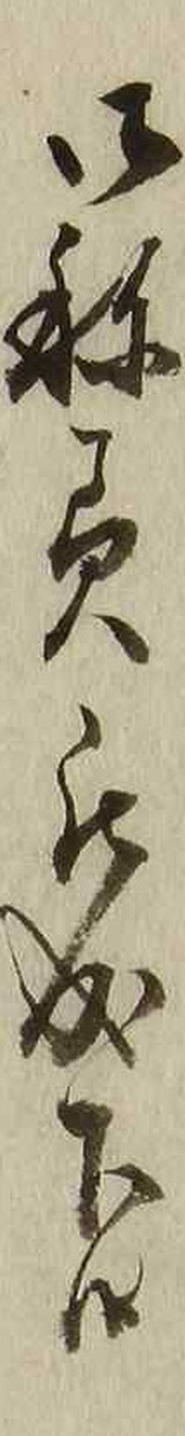御称美被成下候
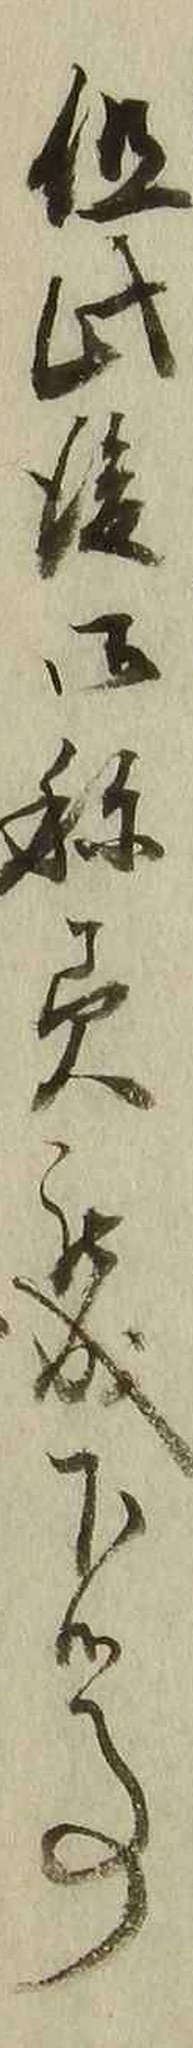但此後御称美被成下候事
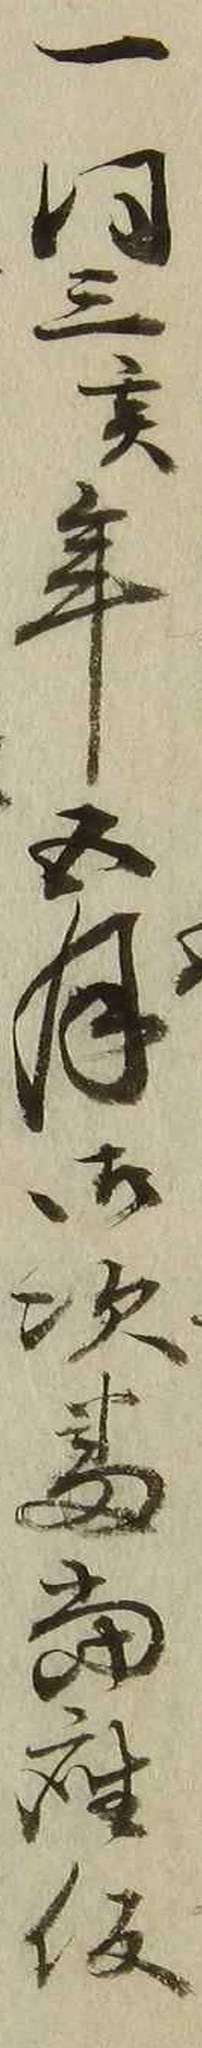一同三亥年五月御次番当座仮
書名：諸士系譜　巻之36　は之部4
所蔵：会津若松市立会津図書館
